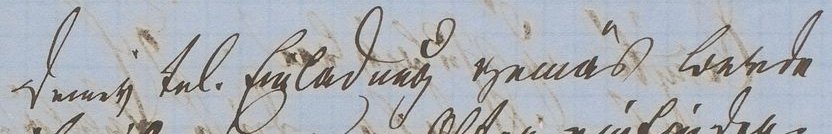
Deiner tel. Einladung gemäs werde
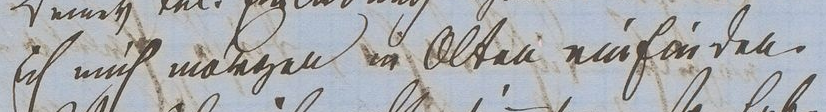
ich mich morgen in Olten einfinden.
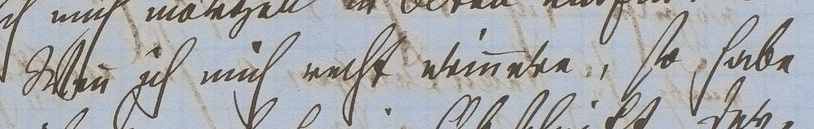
Wenn ich mich recht erinnere, so habe
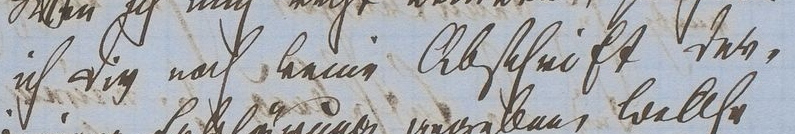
ich Dir noch keine Abschrift der-
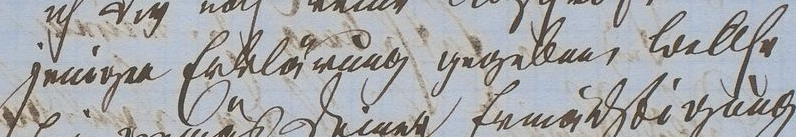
jenigen Erklärung gegeben, welche
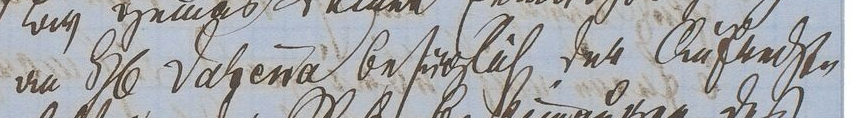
an Herrn Varenna bezüglich der Aufrecht-
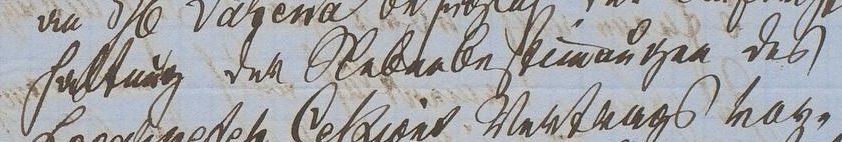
haltung der Nebenbestimmungen des
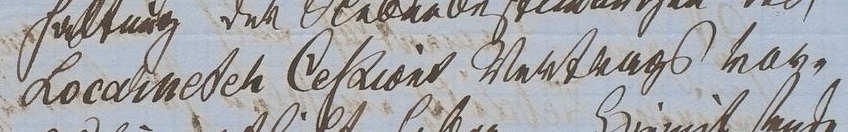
Locarneser Cessions Vertrags vor-
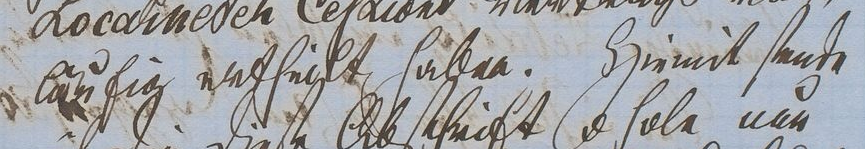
läufig ertheilt haben. Hiemit sende
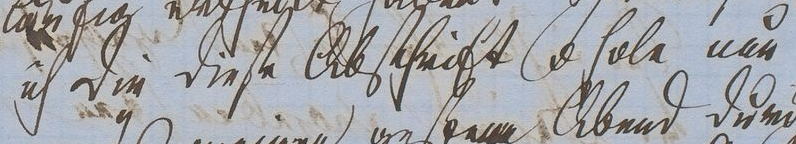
ich Dir diese Abschrift & hole nun
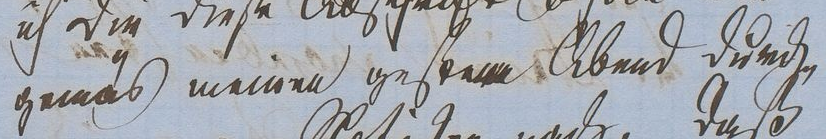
gemäs meinen gestern Abend durch-
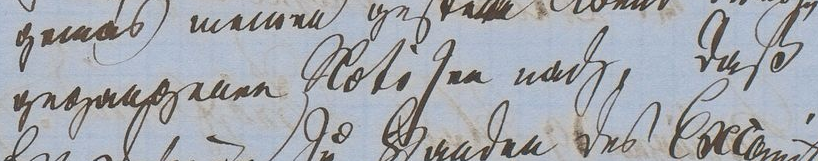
gegangenen Notizen nach, daß
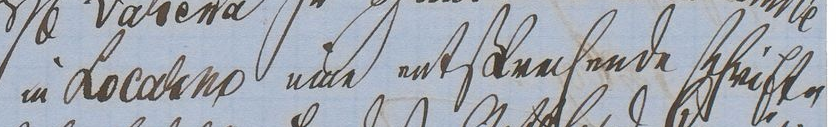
in Locarno eine entsprechende schrift-
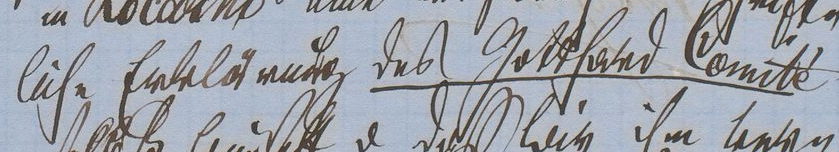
liche Erklärung des Gotthard Comité
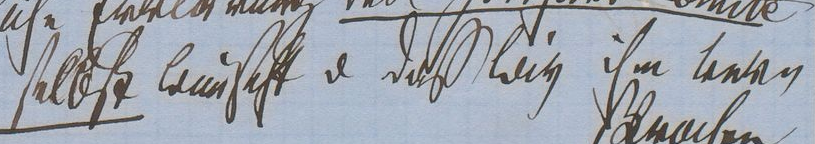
selbst wünscht & dass wir ihm ver-
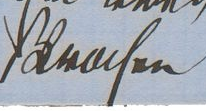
sprochen
